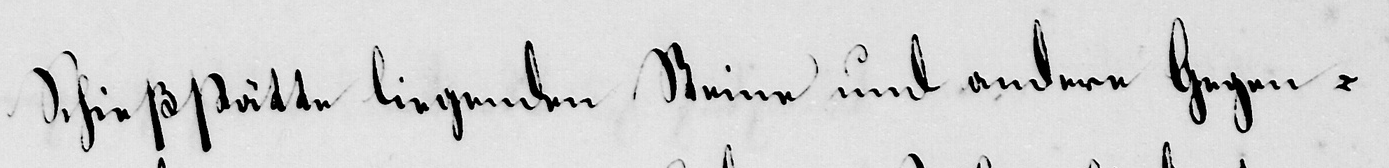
Schießstätte liegenden Steine und andere Gegen¬
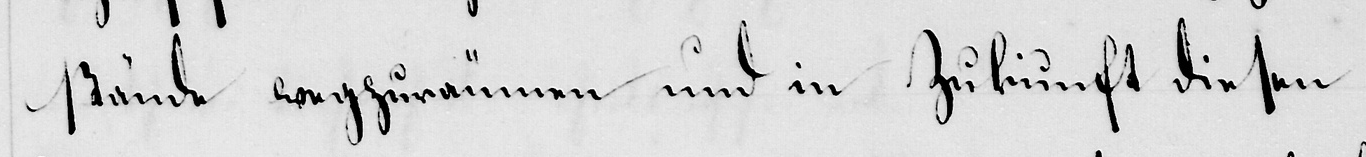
stände wegzuräumen und in Zukunft diesen
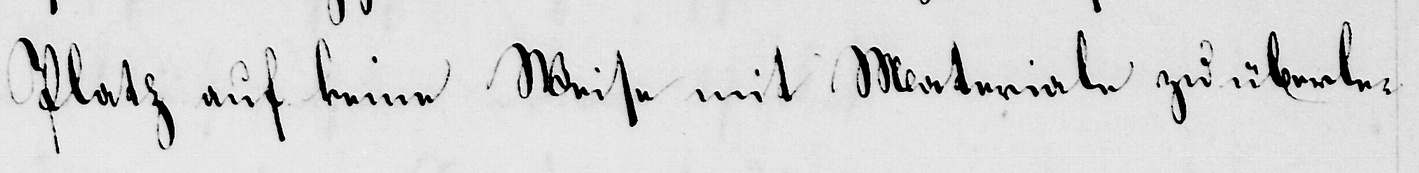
Platz auf keine Weise mit Materiale zu überle¬
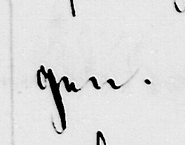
gen.
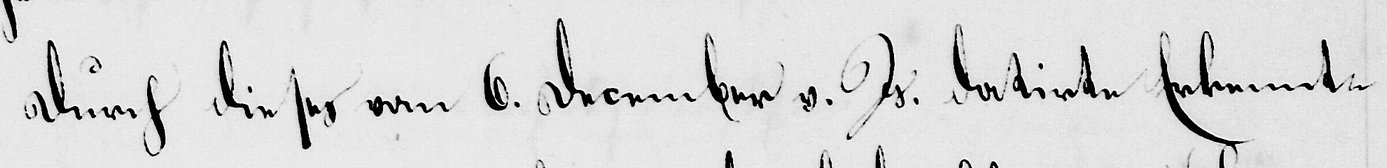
Durch dieses vom 6. December v. Js. datirte Erkennt¬
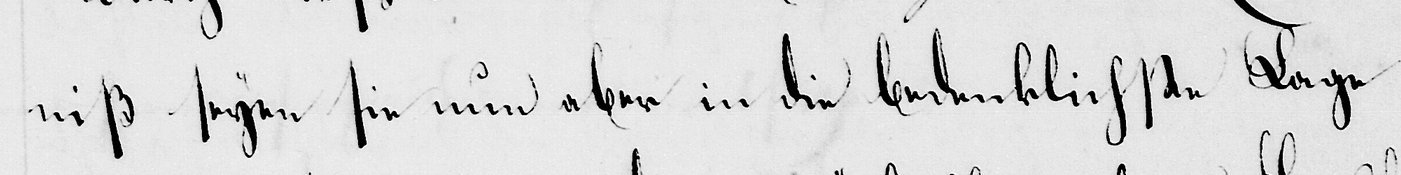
niß seyen sie nun aber in die bedenklichste Lage
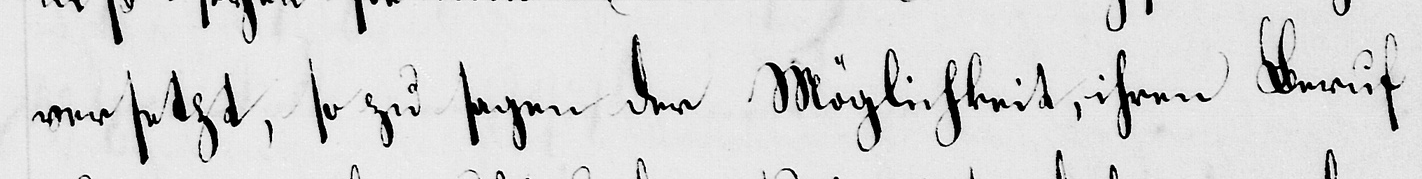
versetzt, so zu sagen der Möglichkeit, ihren Beruf
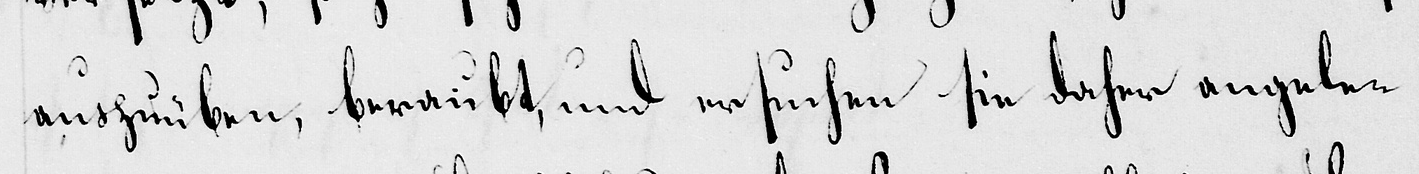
auszuüben, beraubt, und ersuchen sie daher angele¬
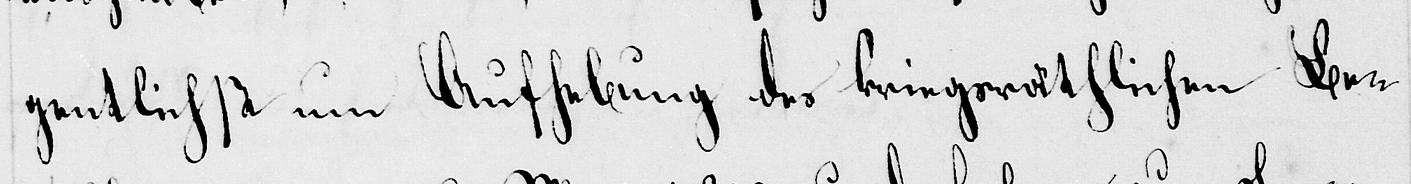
gentlichst um Aufhebung des kriegsräthlichen Be¬
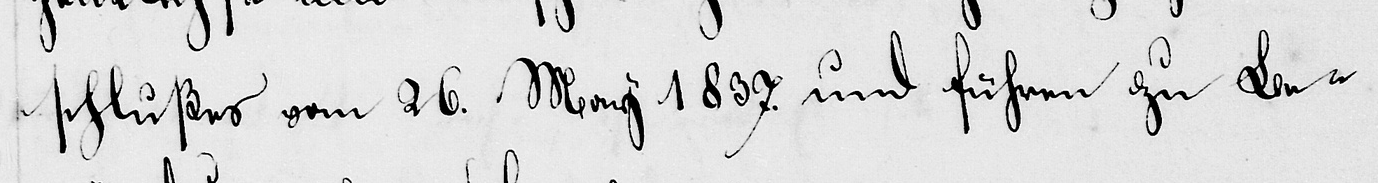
schlußes vom 26. May 1837. und führen zu Be¬
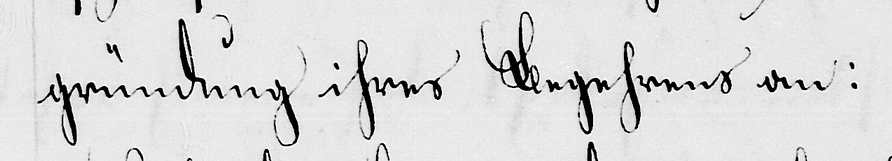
gründung ihres Begehrens an:
